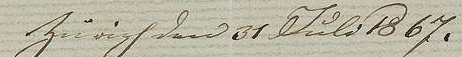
Zürich den 31 Juli 1867.
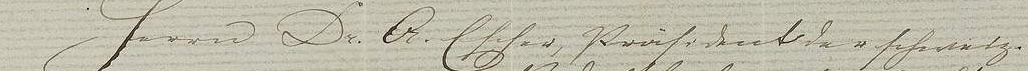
Herrn Dr. A. Escher, Präsident der schweiz.
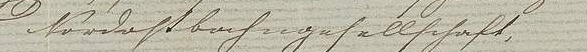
Nordostbahngesellschaft
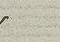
Hier.
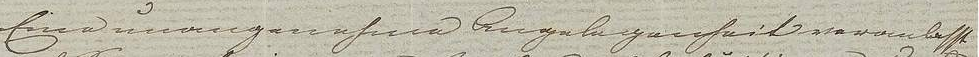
Eine unangenehme Angelegenheit veranlasst
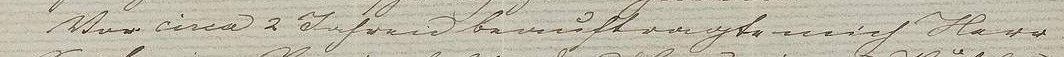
Vor circa 2 Jahren beauftragte mich Herr
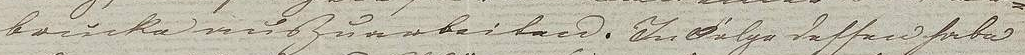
brücke auszuarbeiten. In Folge dessen habe
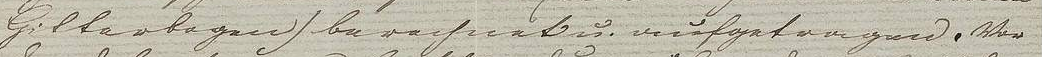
Gitterbogen) berechnet u. aufgetragen. Vor
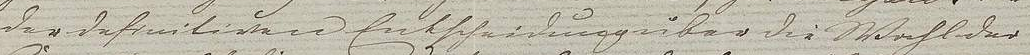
der definitiven Entscheidung über die Wahl der
